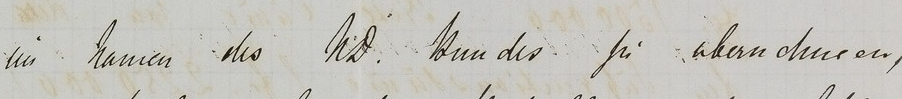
im Namen des ND. Bundes zu übernehmen,
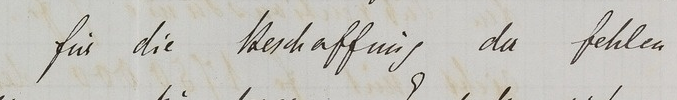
für die Beschaffung der fehlen-
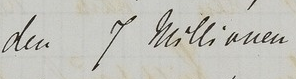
den 7 Millionen zu
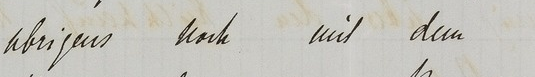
übrigens noch mit dem
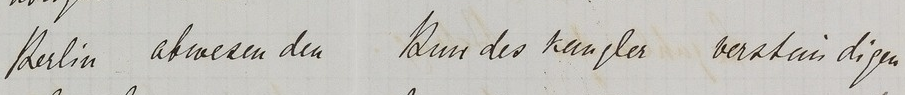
Berlin abwesenden Bundeskanzler verständigen.
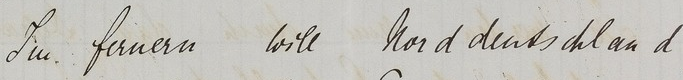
Im Fernern will Norddeutschland
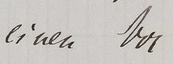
einen Vor-
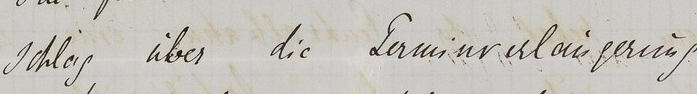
schlag über die Terminverlängerung
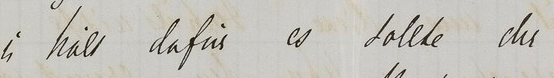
u hält dafür es sollte der
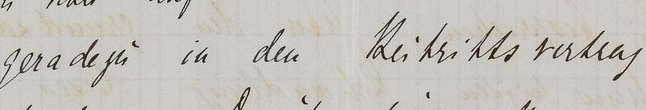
geradezu in den Beitrittsvertrag
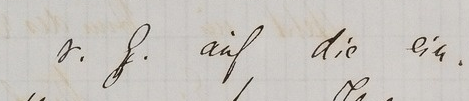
v. G. auf die ein-
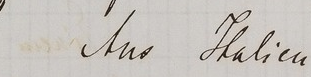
Aus Italien
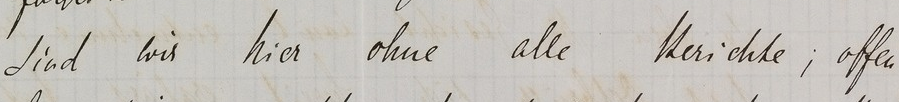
sind wir hier ohne alle Berichte; offen-
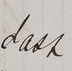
dass
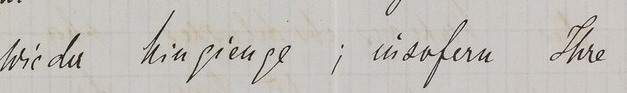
wieder hingienge; insofern Ihre Berichte
